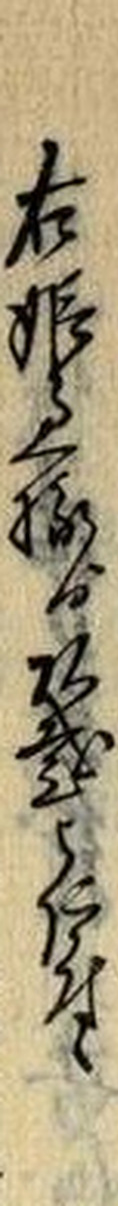右姫君様ゟ頂戴被仰付候
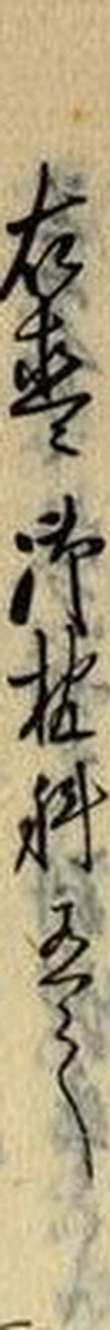右直ニ御棺拝有之
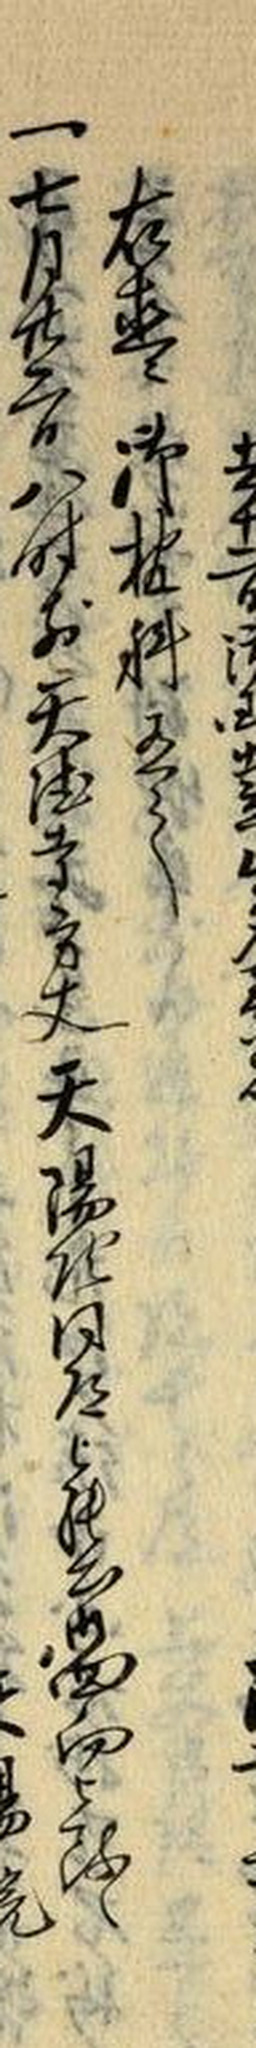一七月廿二日八時前天徳寺方丈天陽院同道被罷出御回向被致候
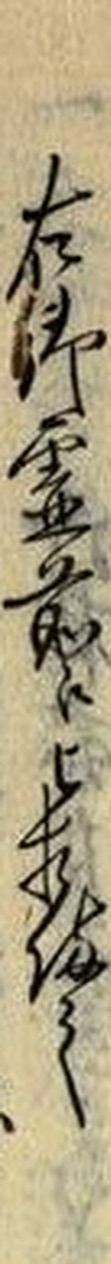右御霊前江被相備之
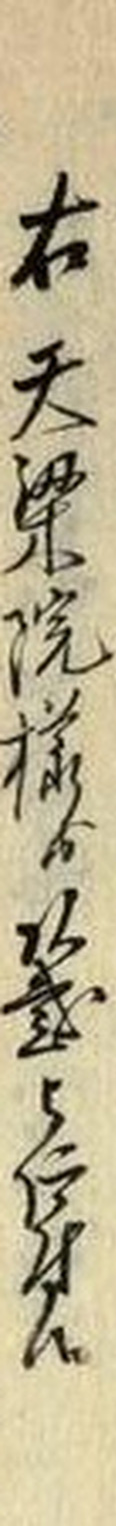右天梁院様ゟ頂戴被仰付候
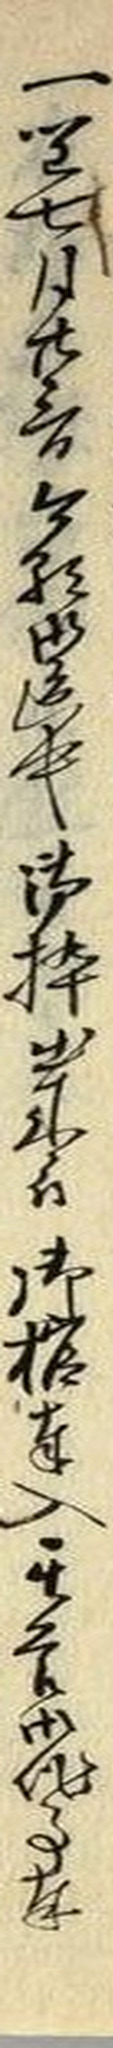一閏七月廿三日今朝御道中御枠出来候付御棺奉入其節御作事奉
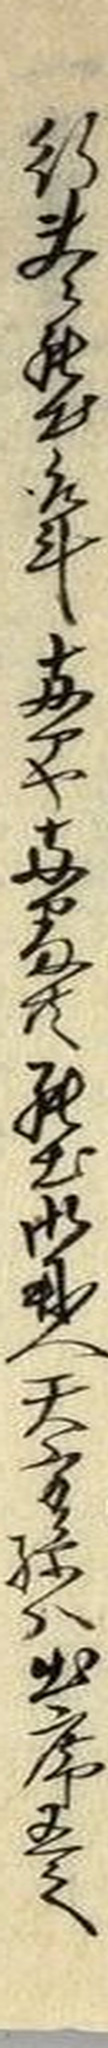行夫々罷出取斗両部や両番共罷出御用人天方孫八出席有之
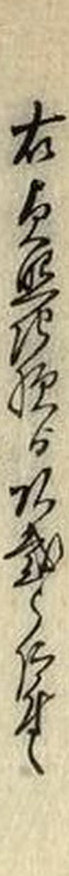右貞照院様ゟ頂戴被仰付候
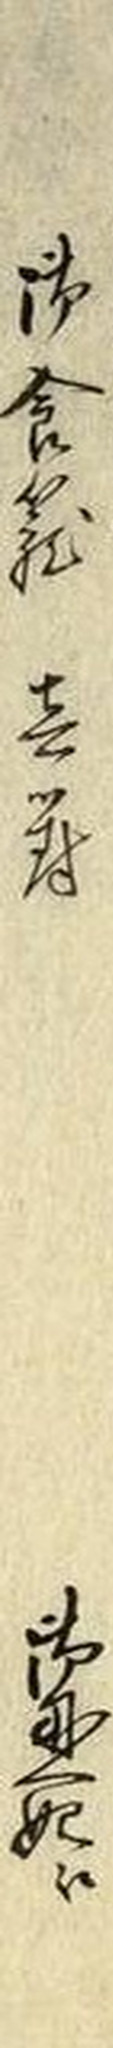御食籠壱対御用人始江
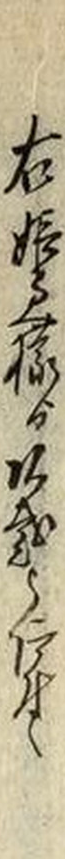右姫君様ゟ頂戴被仰付候
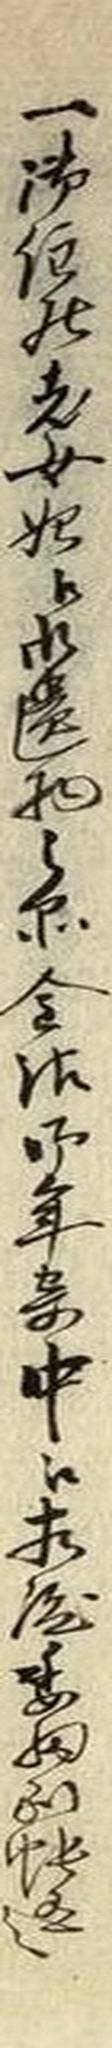一御住居老女始江御遺物之品金銀御年寄中江相渡委細別帳有之
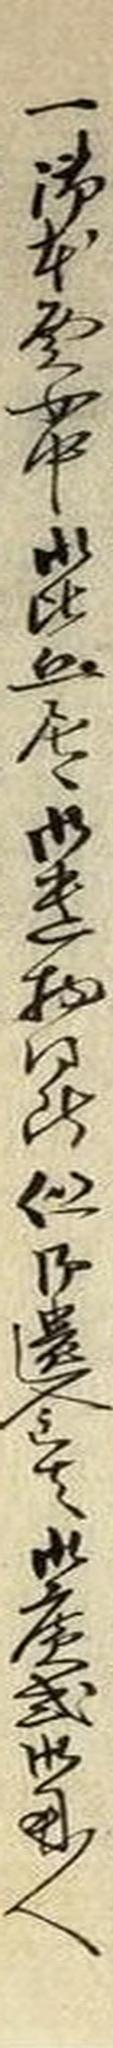一御本殿女中御比丘尼へ御遺物同断但御遺金は御広式御用人
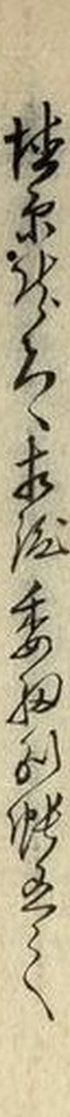埴原次郎右衛門へ相渡委細別帳有之

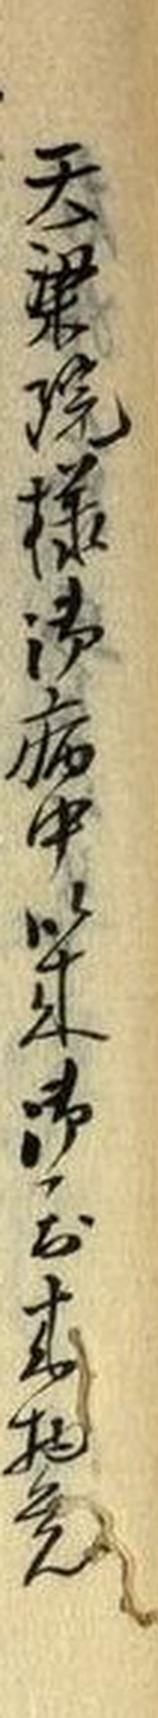天梁院様御病中以来御到来物覚
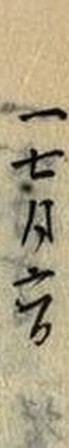一七月六日
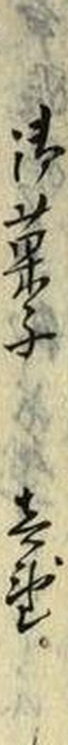御菓子壱台
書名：少傅日録抄（斉承付側向頭取日記、在府）
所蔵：福井県文書館 Fukui Prefectural Archives
